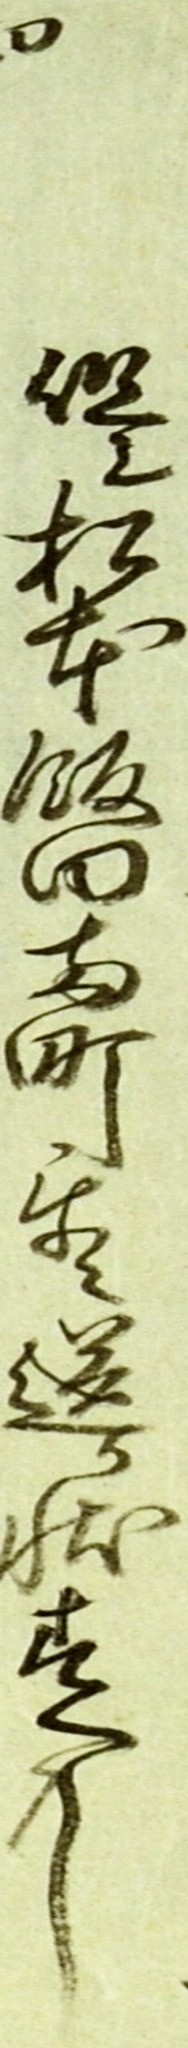但シ松本飯田両町互ニ送り状すへし
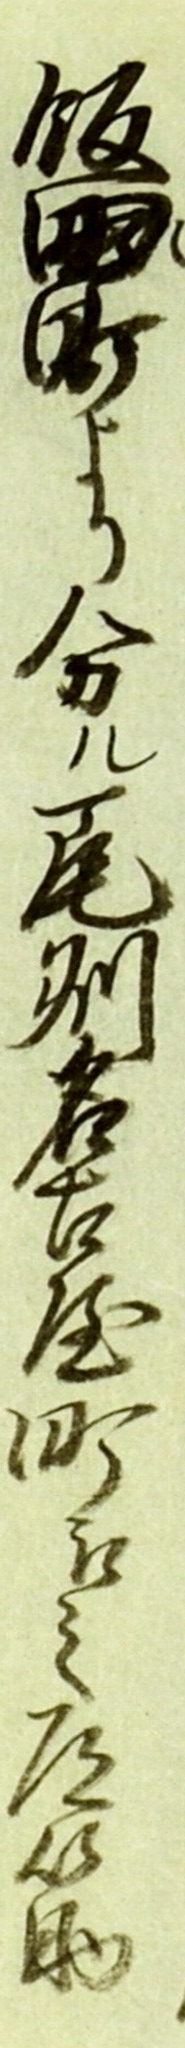飯町より分ル尾州名古屋町江之道筋
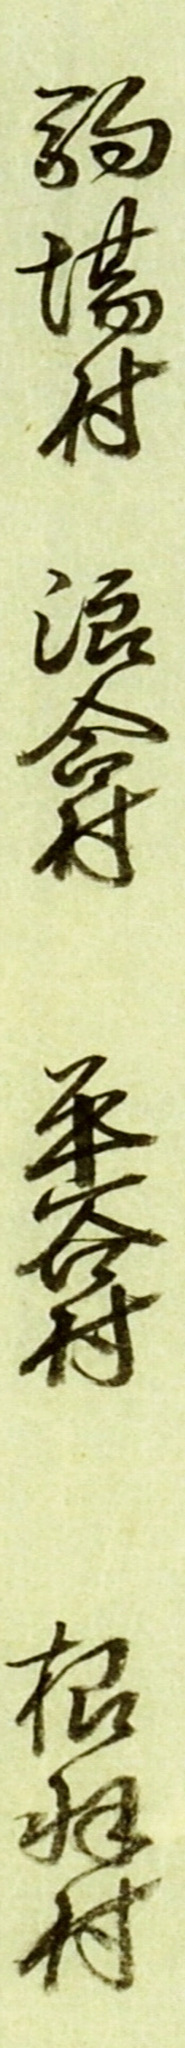駒場村波合村平谷村様羽村
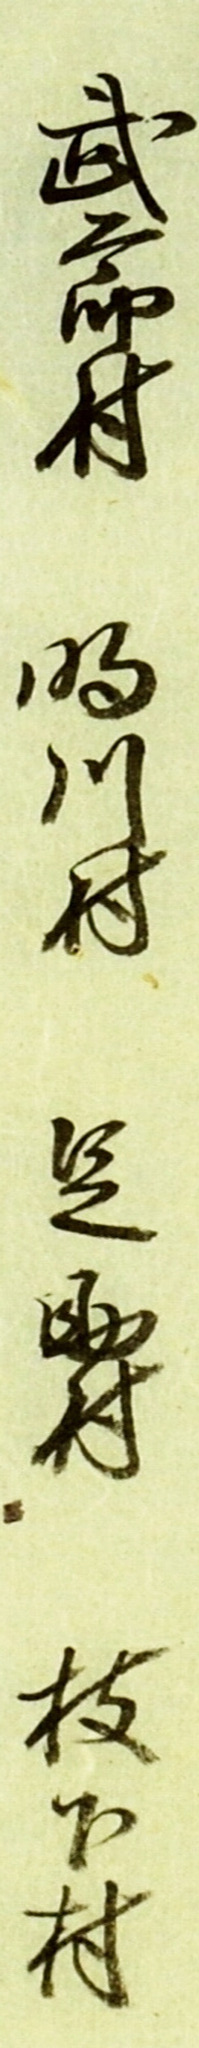武節村明川村足助村枝下村
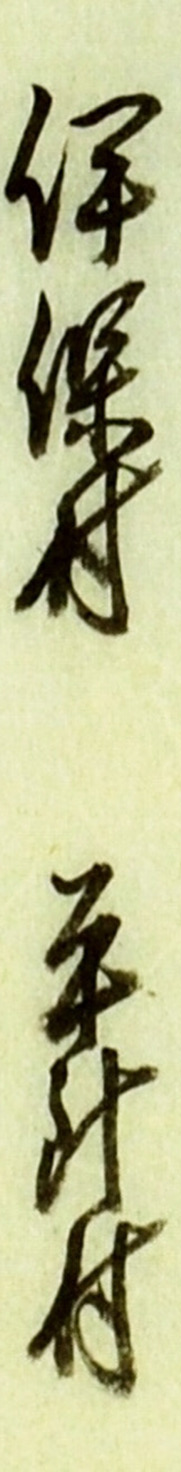伊保村平針村
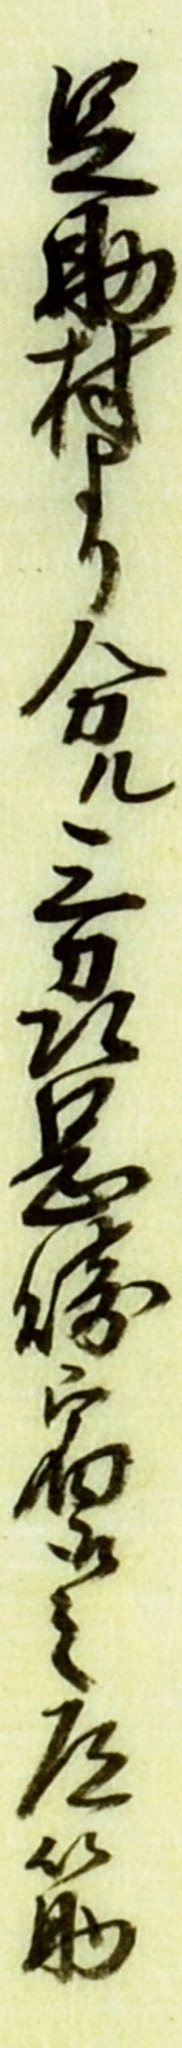足助村より分ル三州岡崎宿江之道筋
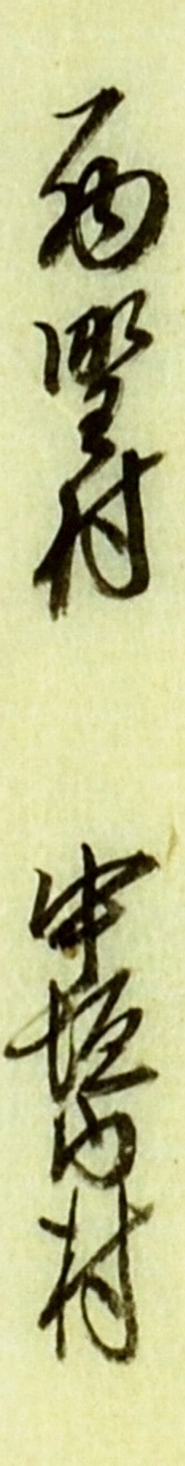西野村中垣内村
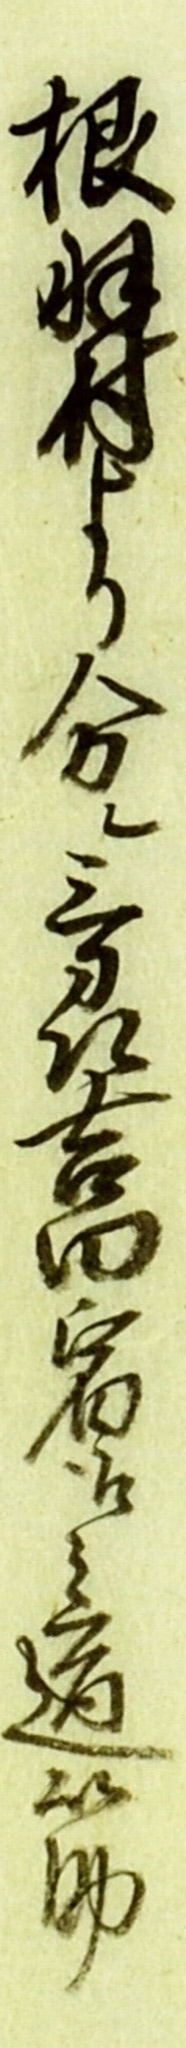根羽村より分レ三州吉田宿江之道筋
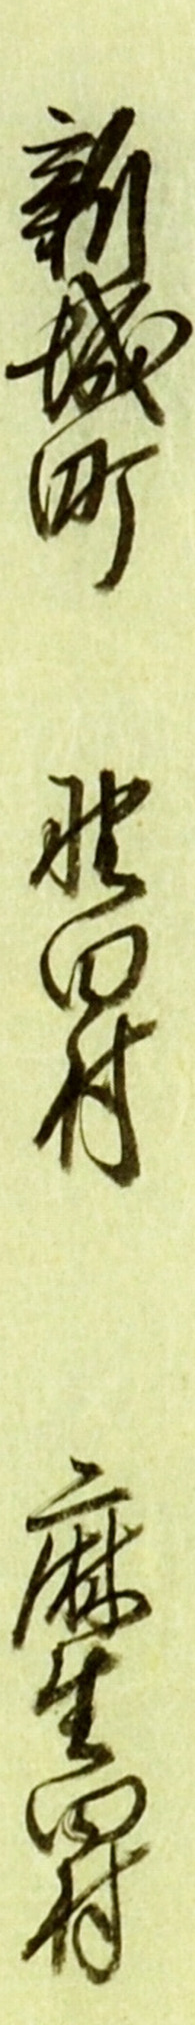新城町野田村麻生田村
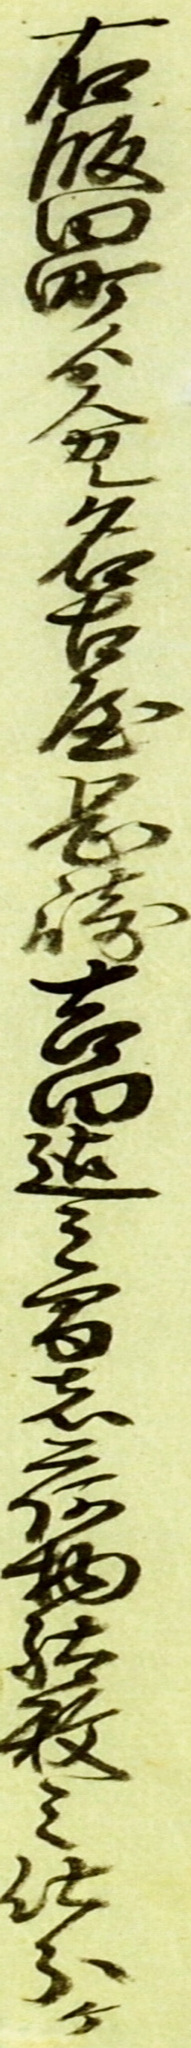右飯田町ゟ分レ名古屋岡崎吉田迄之間者荷物駄数之仕分ヶ
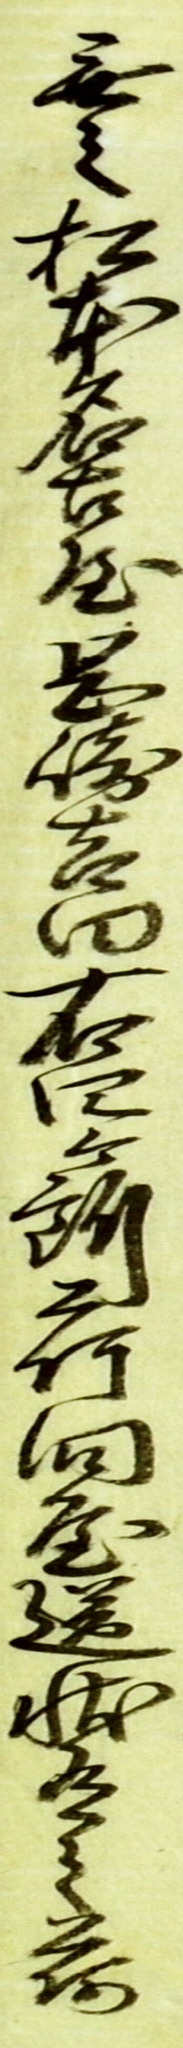無之松本名古屋岡崎吉田右四ヶ所荷問屋送状有之荷

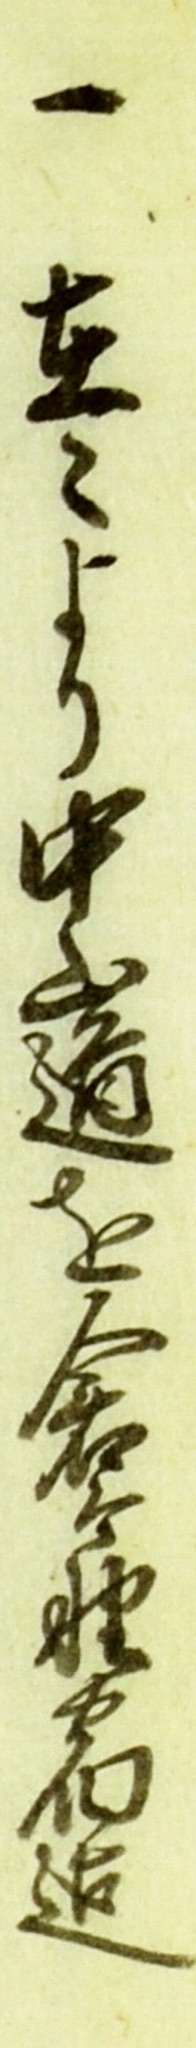一在々より中山道を倉ヶ野宿迄
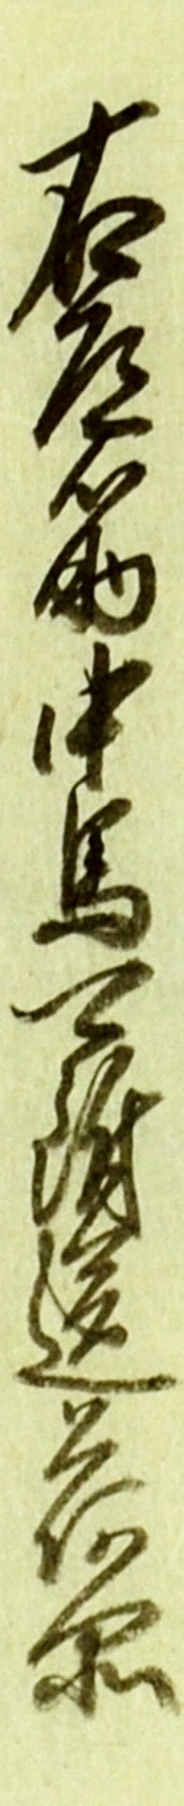右道筋中馬可附送荷品
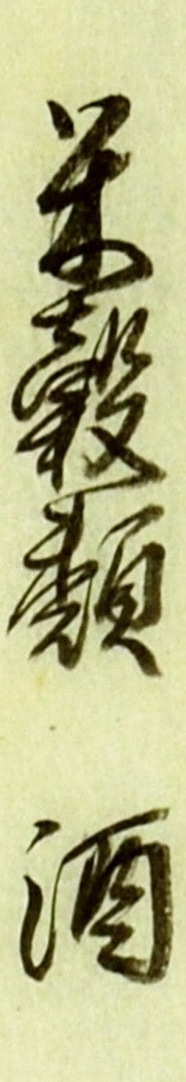米穀類酒
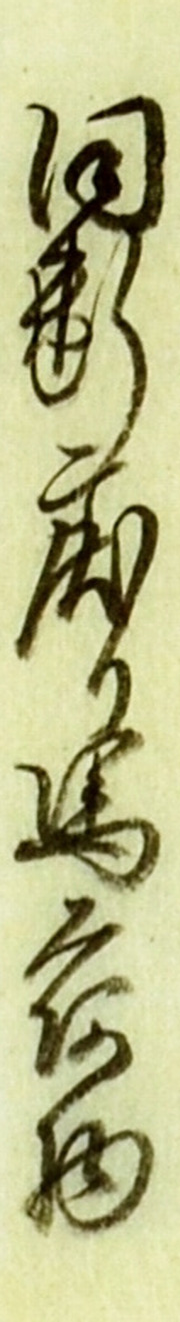同断戻り馬荷物
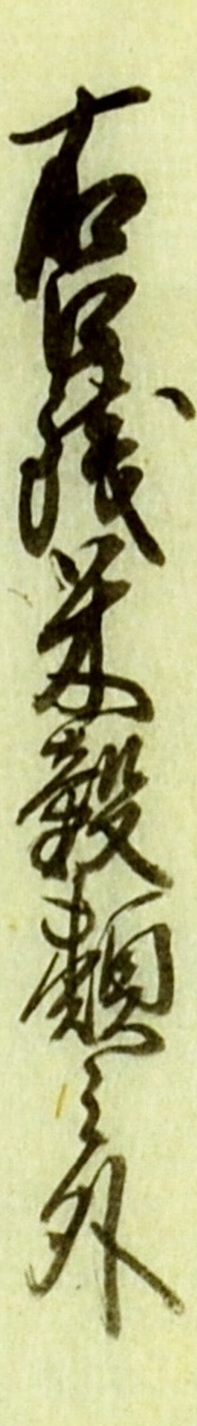右口銭米穀類之外
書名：中馬荷物并口銭中馬稼之村名馬数等申渡書
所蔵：伊那市立高遠町図書館・合同会社AMANE
